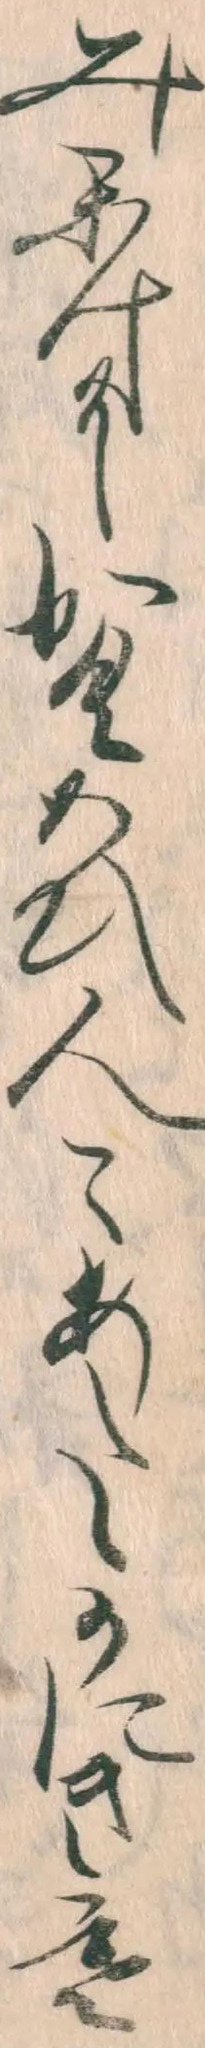みかけにかくろひ人々あたゝかにき寒
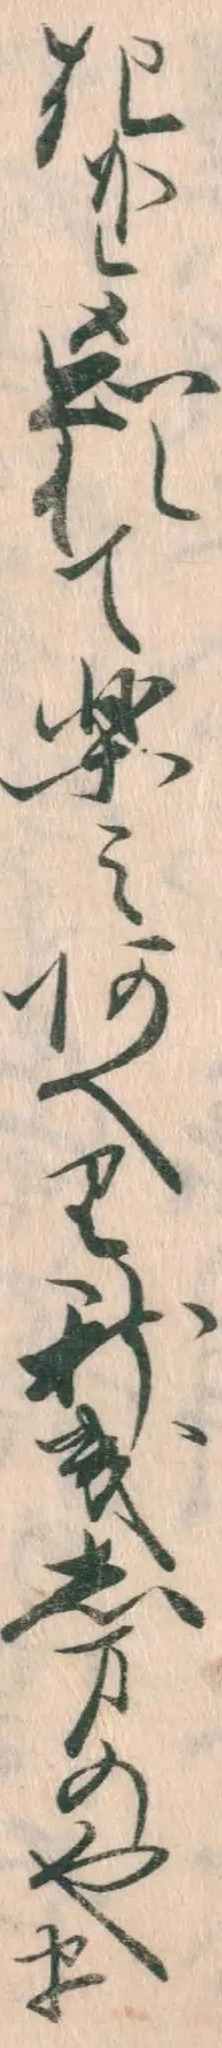きを忘れて楽みあへりしきしまのやま
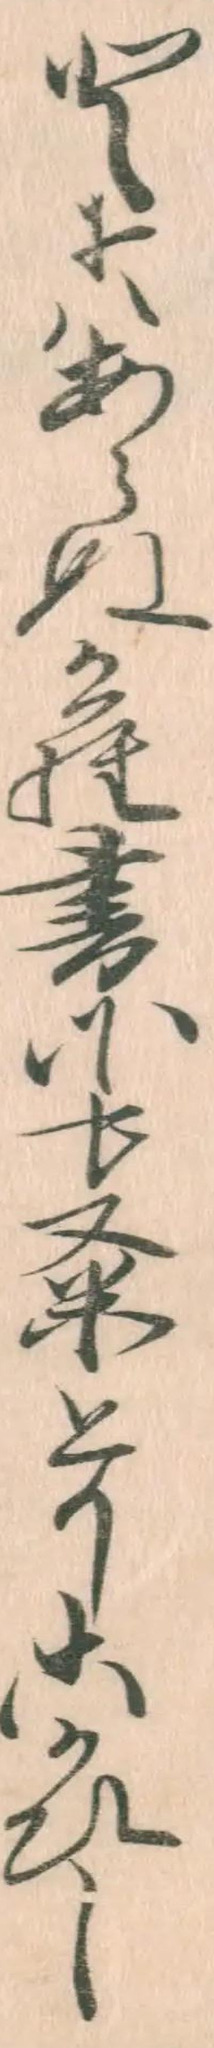とにはあらぬから書にも桑とりこがひし
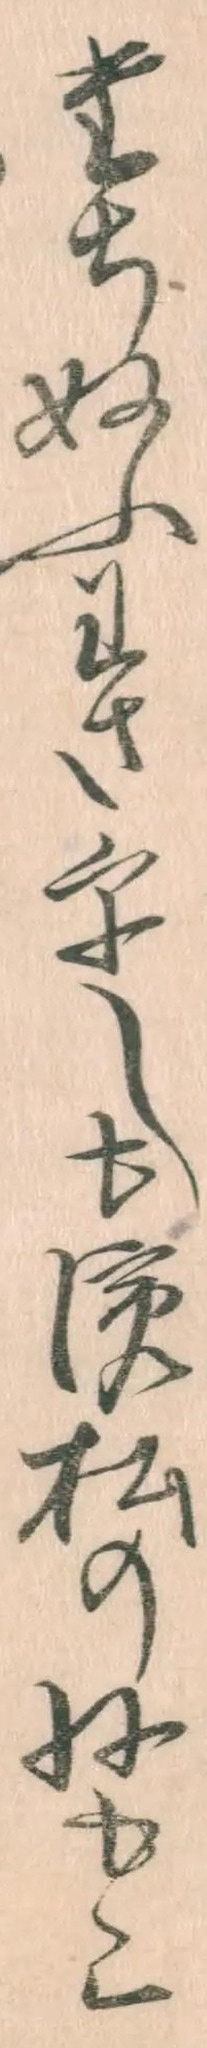たちぬふわさをしも浜松のねもこ
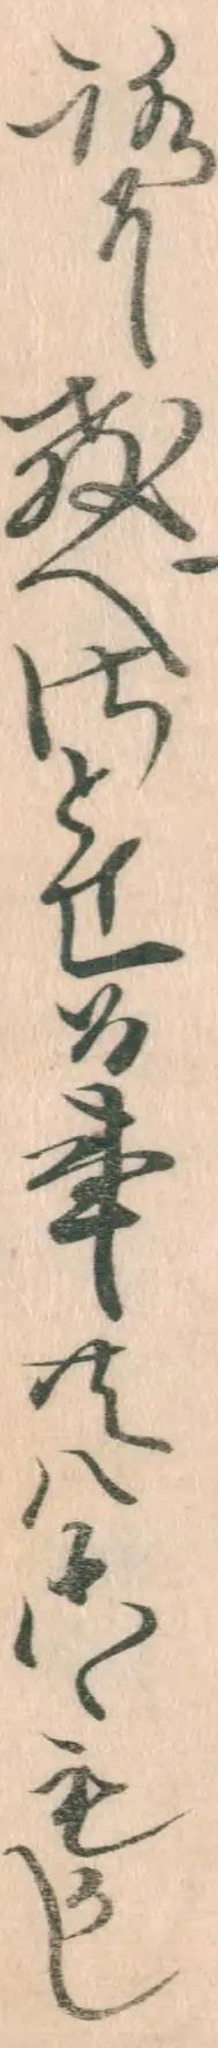ろに教へさとせる事共はこゝもかし
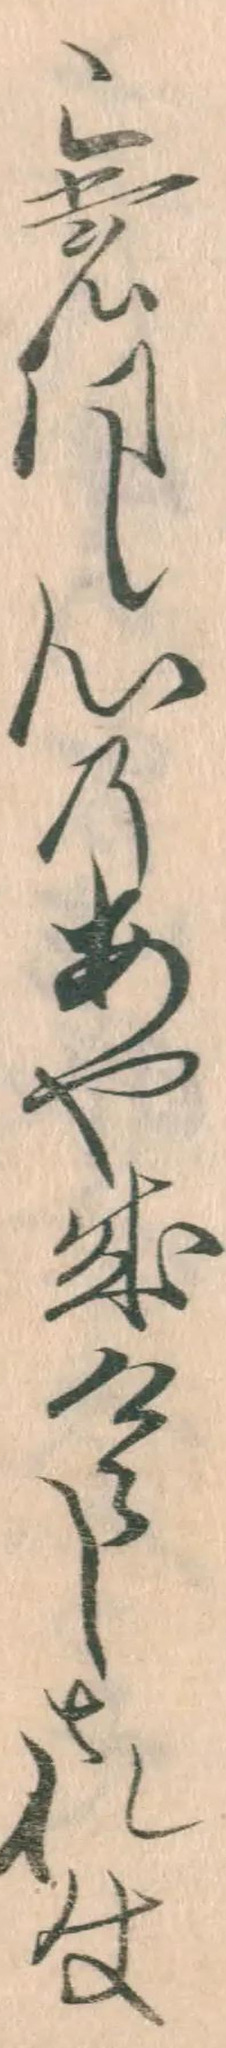こも同し心のあや成けらしされは
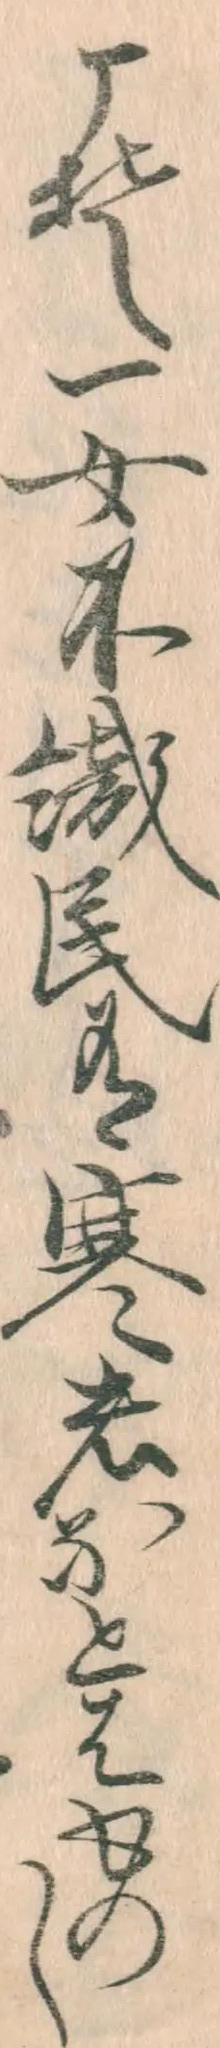こそ一女不織民有寒者なとはものし
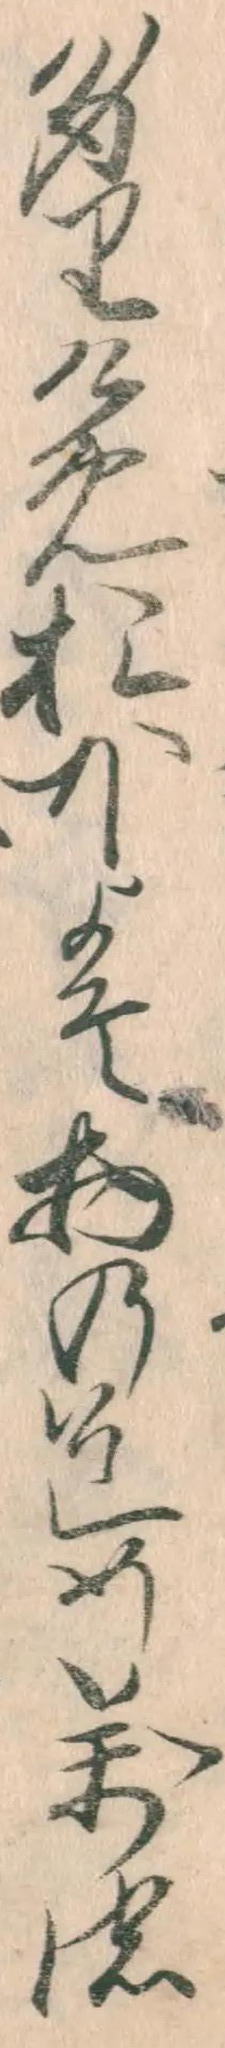たりけめおほよそ物の色め万の
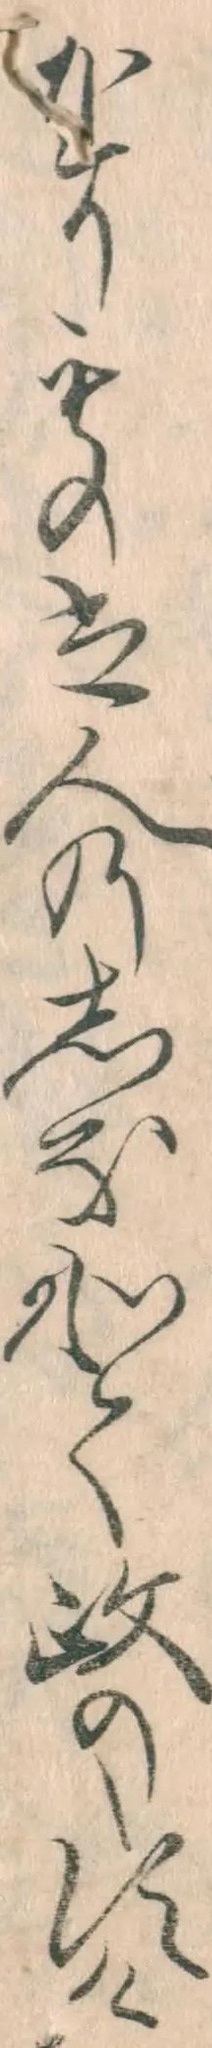をりものは人のしなれて政のしつけ
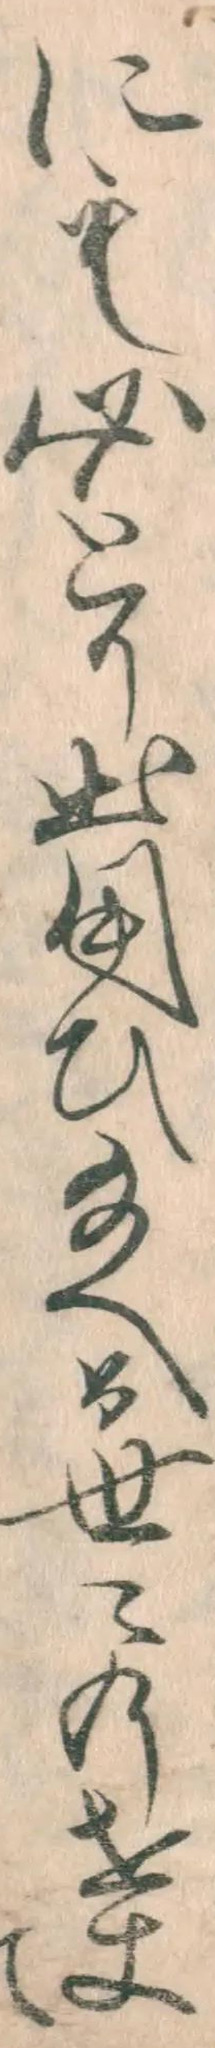にも必とり出用ひ給へる世々のをきて
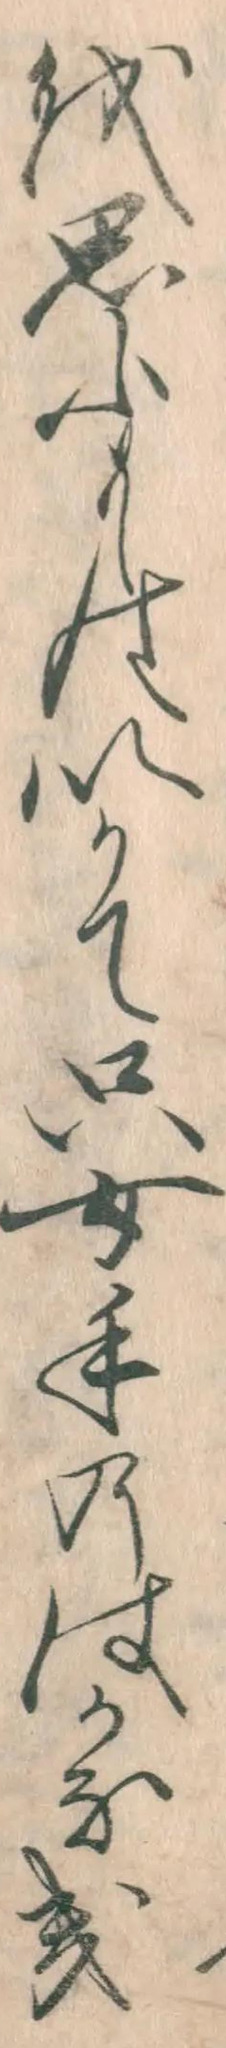を思ふものはいかて只女手のはかなき

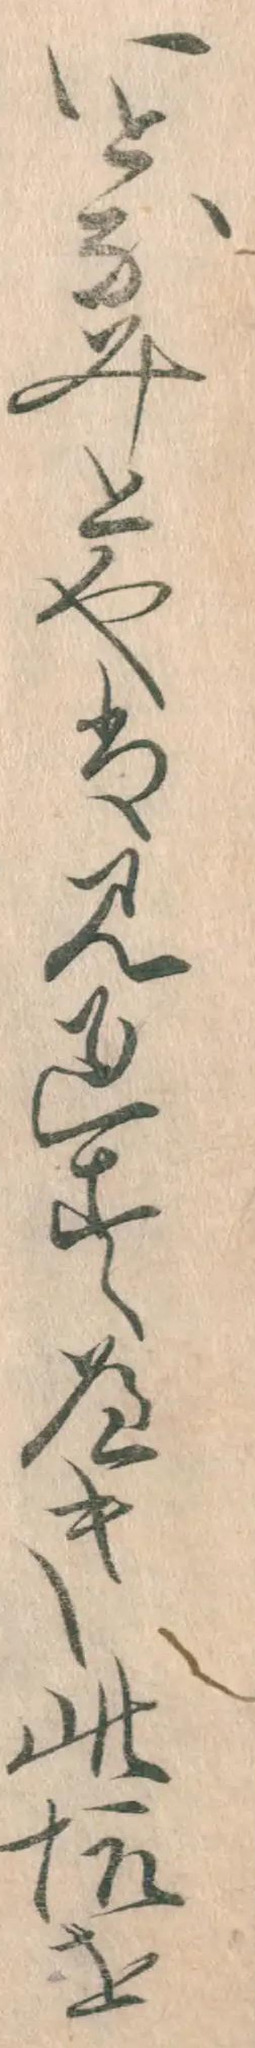いとなみとやは見過すへき此趣を
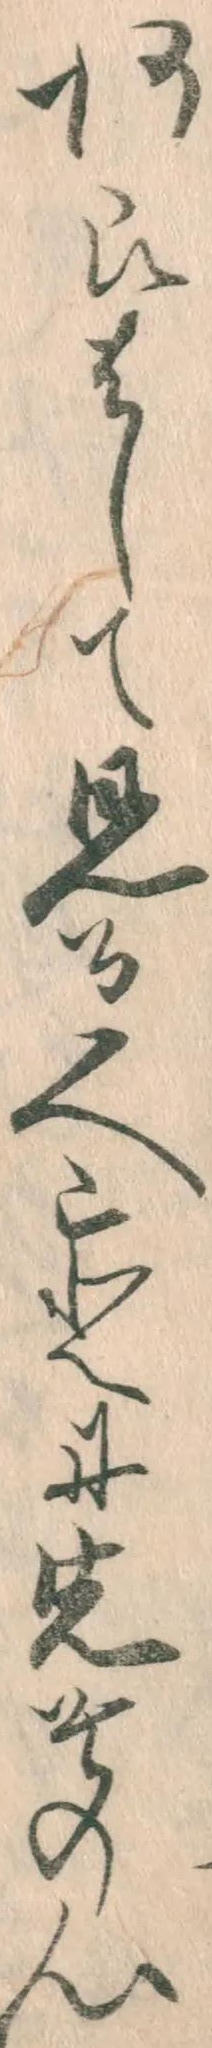あらはして見る人ことに先その心
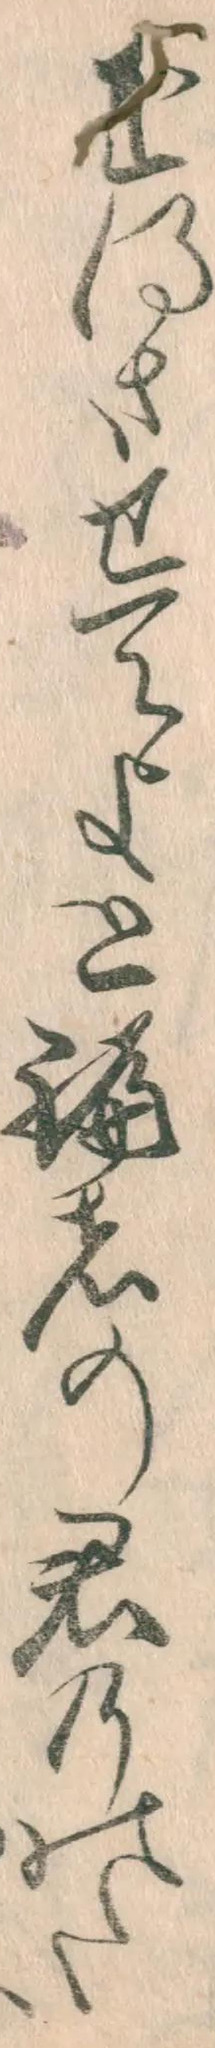を得させてよと編者の君ののたまふ
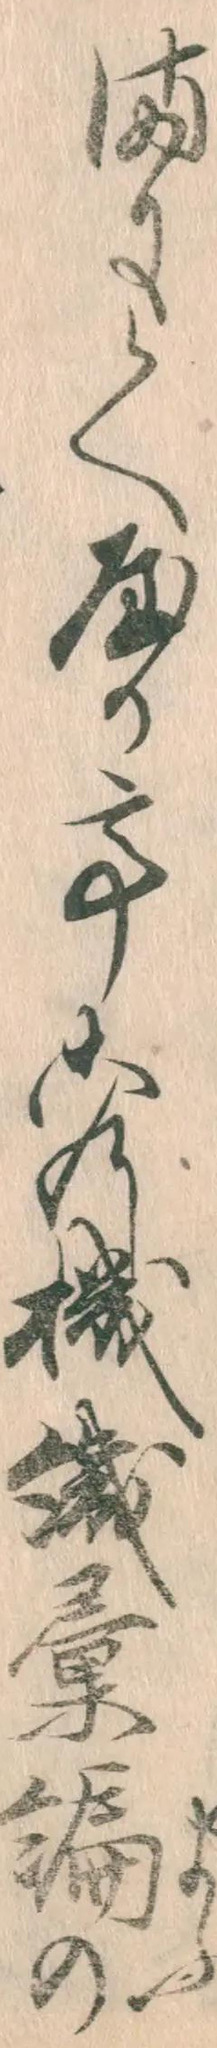まに〳〵やがてこの機織彙編の
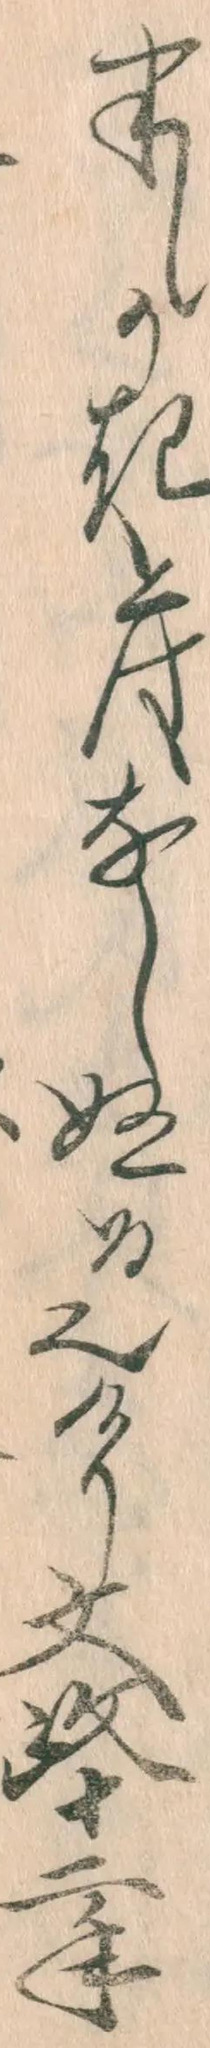はしかきとはなしぬる也けり文政十二年
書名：機織彙編 5巻. [1]
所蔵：国立国会図書館 National Diet Library, JAPAN
